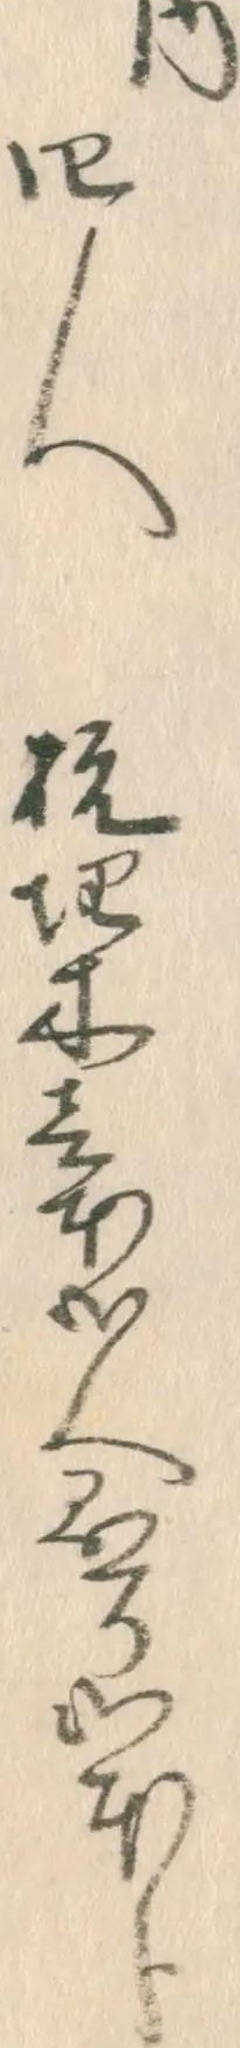四人杭埋木壱本弐人懸り弐本分
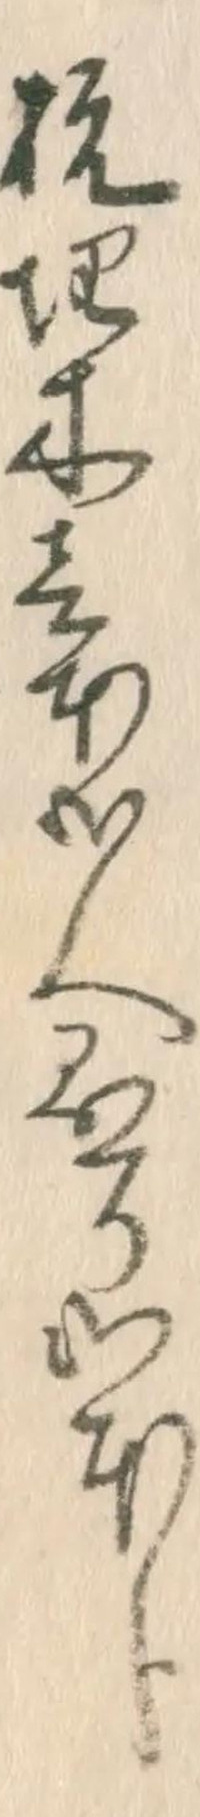四人杭埋木壱本弐人懸り弐本分
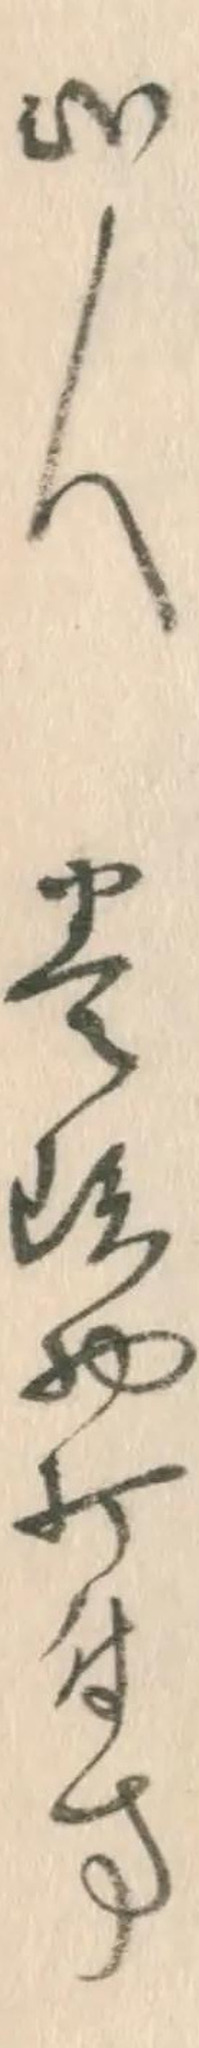弐人巻鉄物打付方

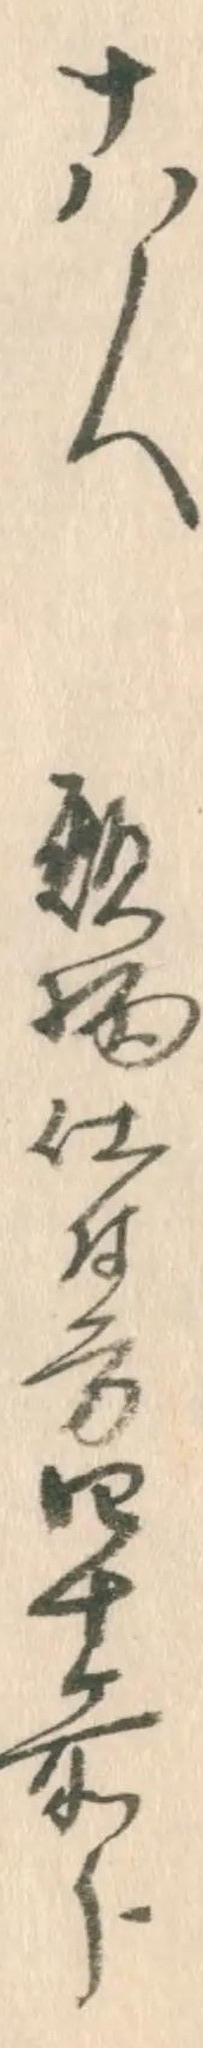十八人頬柄仕付方四十ケ所分
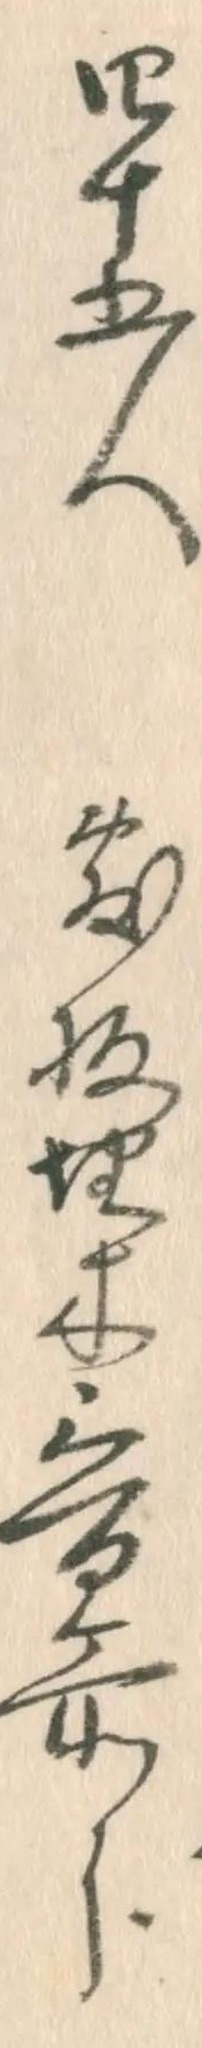四十五人敷板埋木三百ケ所分
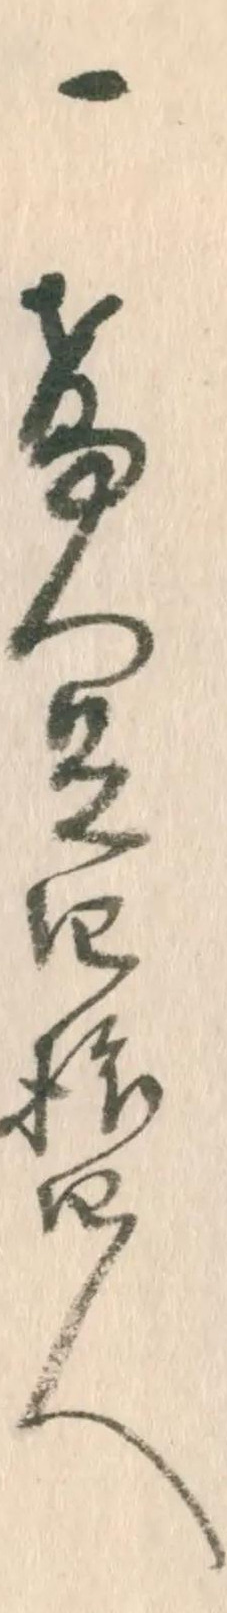一鳶人足四拾四人
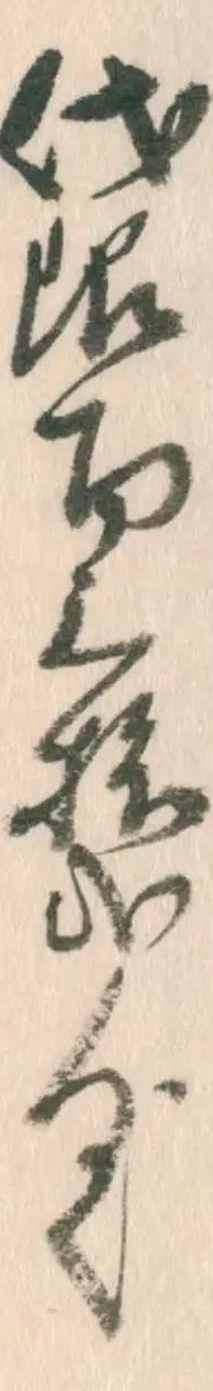代銀百三拾弐匁但壱人銀三匁
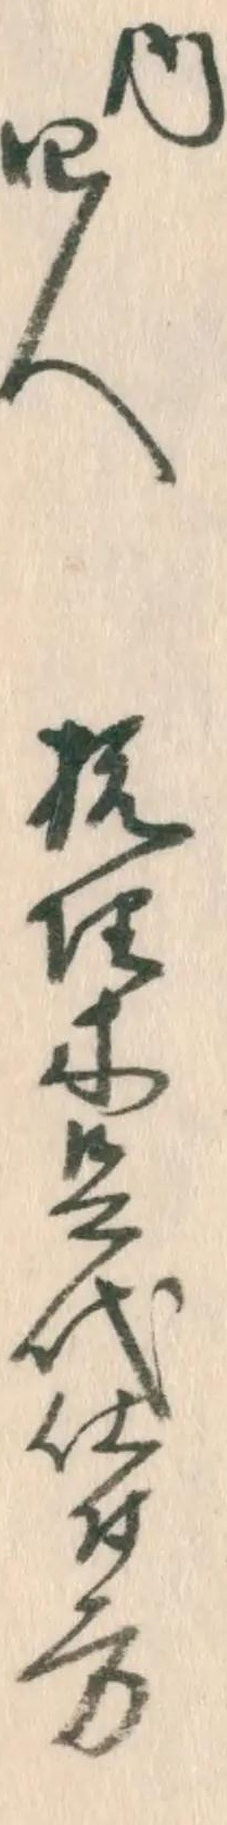四人杭埋木足代仕付方
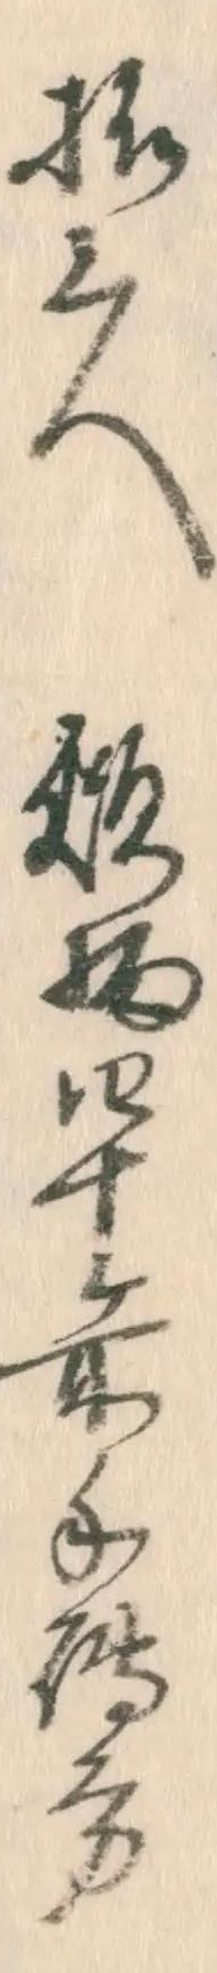拾三人頬柄四十ケ所手伝方
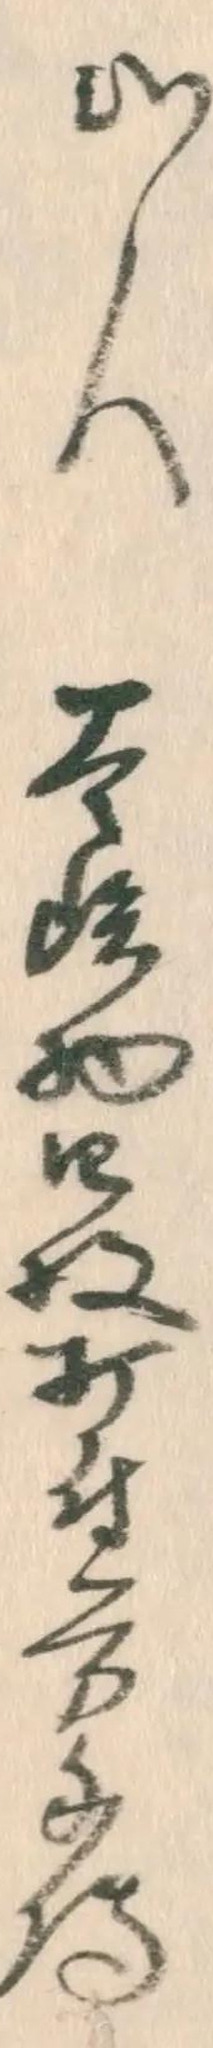弐人巻鉄物四枚打付方手伝
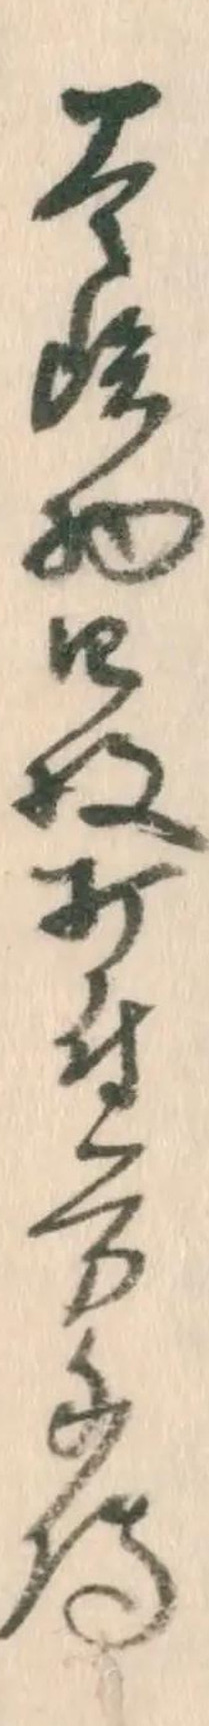弐人巻鉄物四枚打付方手伝
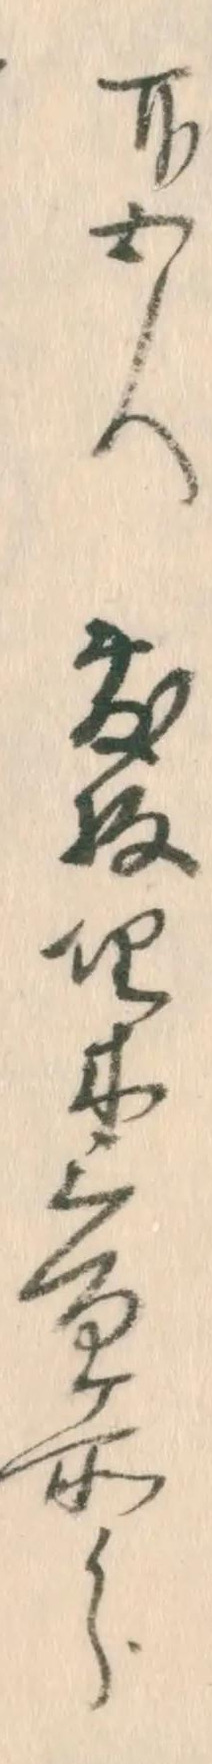廿五人敷板埋木三百ケ所分
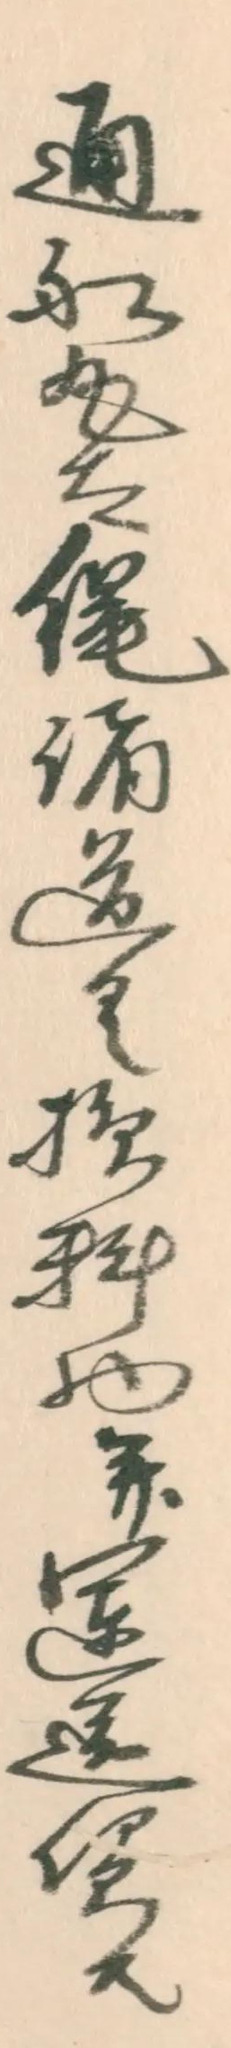一通船丸太縄諸道具損料物并運送賃共
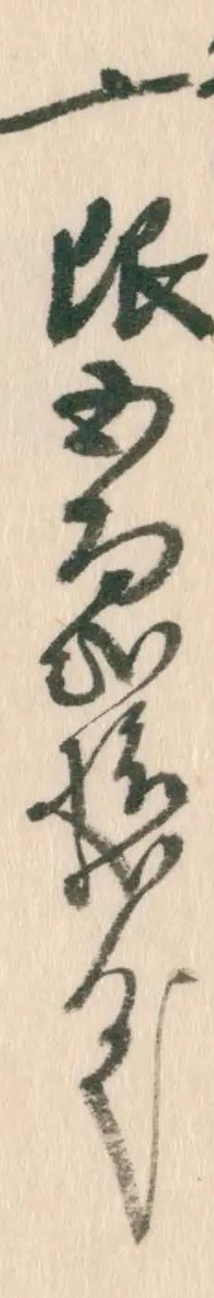〆銀五百弐拾弐匁
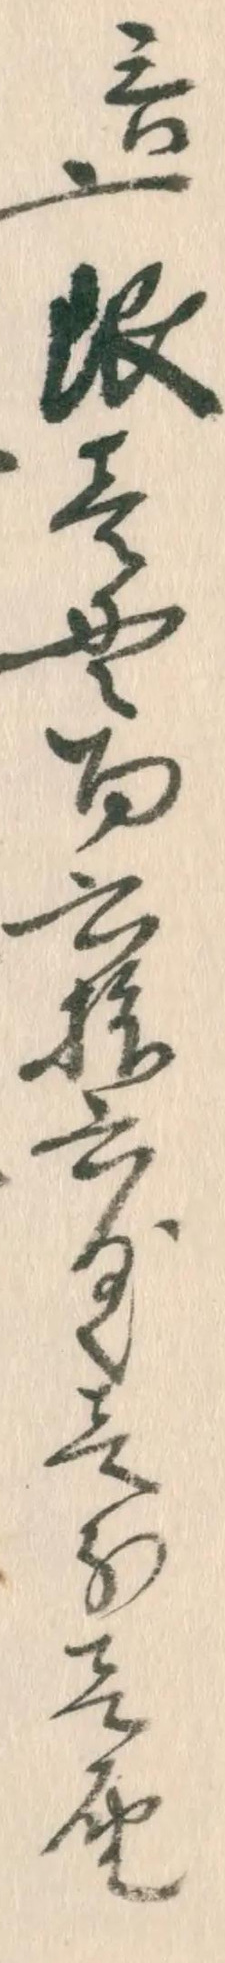〆銀壱貫百六拾六匁壱分壱厘
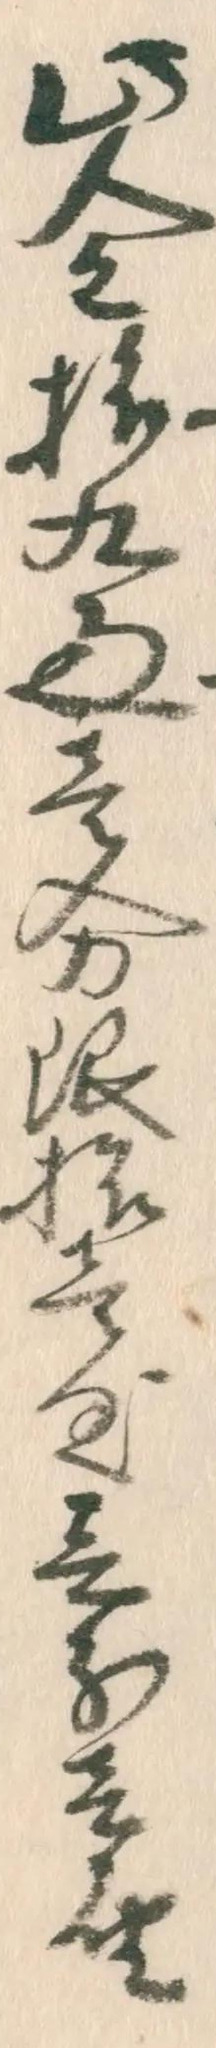此金拾九両壱分銀拾壱匁壱分壱厘
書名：三橋 17巻. [7] 三橋小破御修復書留　但御奉行御掛リ替地震潰橋番屋　嘉永四亥年より安政二卯年迄　上
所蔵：国立国会図書館 National Diet Library, JAPAN
